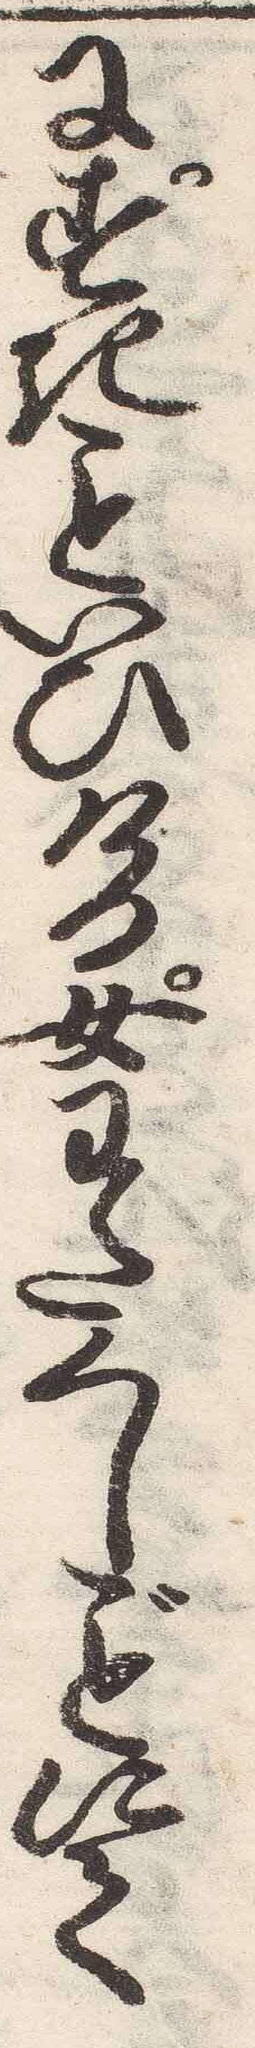に。すきこといひける。女わたくしごとにて
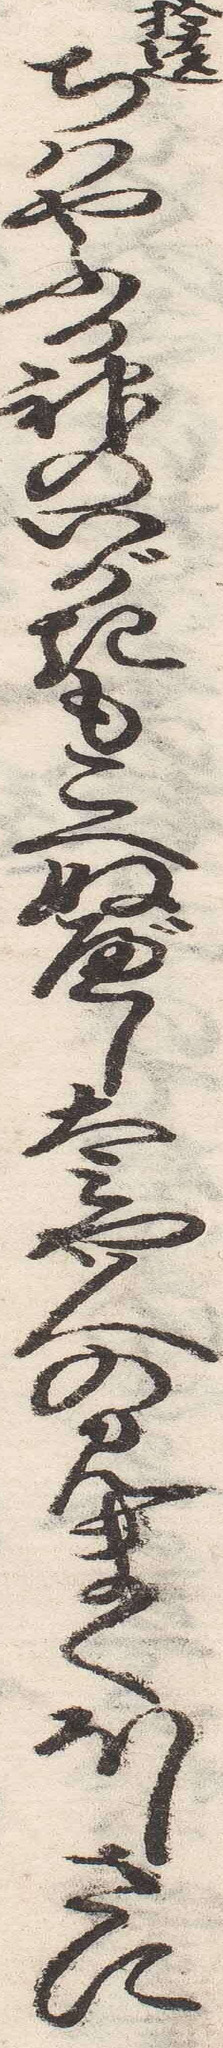上句拾遺ちはやふる神のいがきもこへぬべし大みや人の見まくほしさに
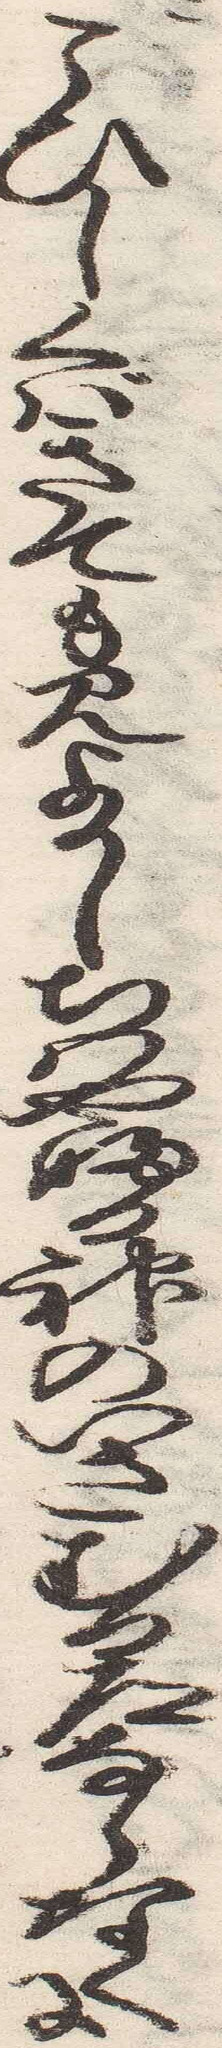こひしくばきても見よかしちはやふる神のいさむる道ならなくに
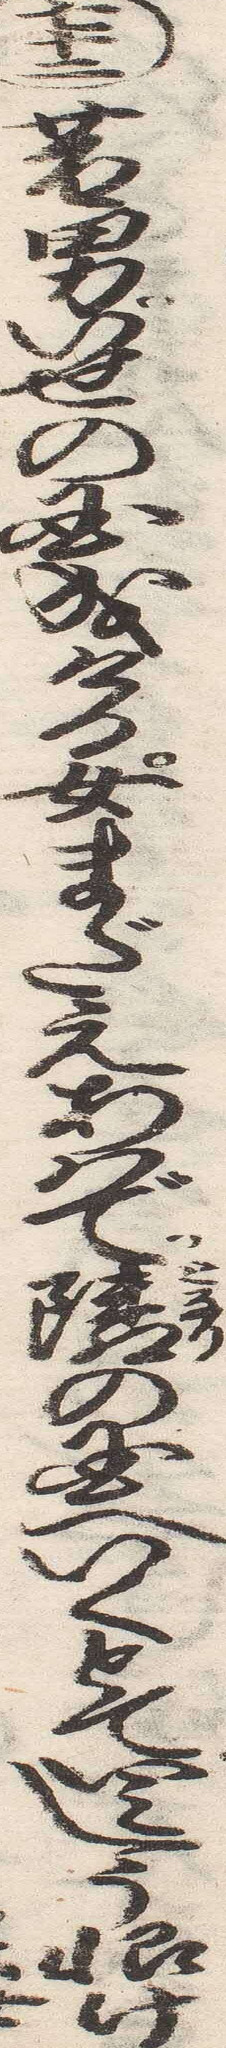七十二昔男。いせの国成ける。女まだえあはで。隣の国へいくとて。いみしう恨けれは女
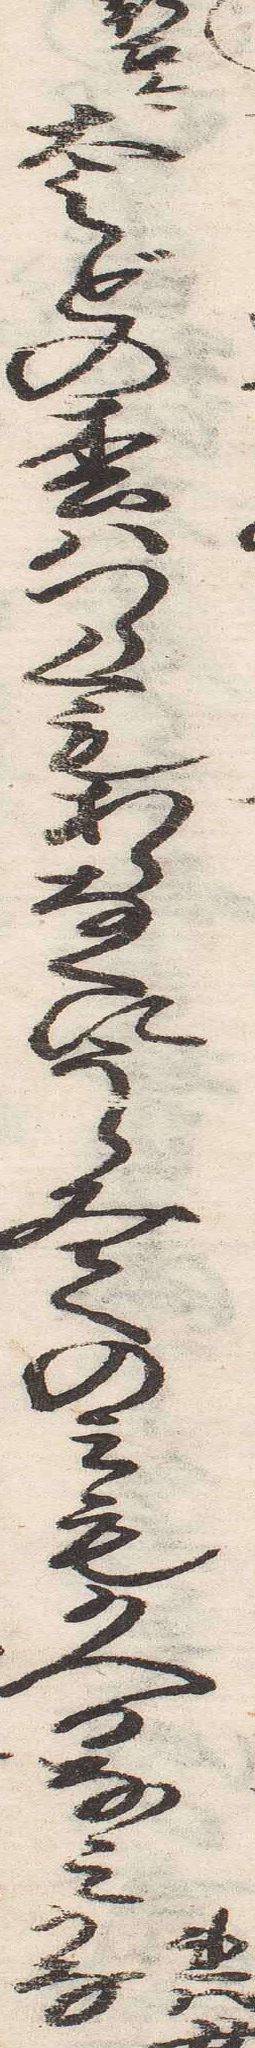新古今大よどの松はつらくもあらなくにうらみてのみもかへるなみかな
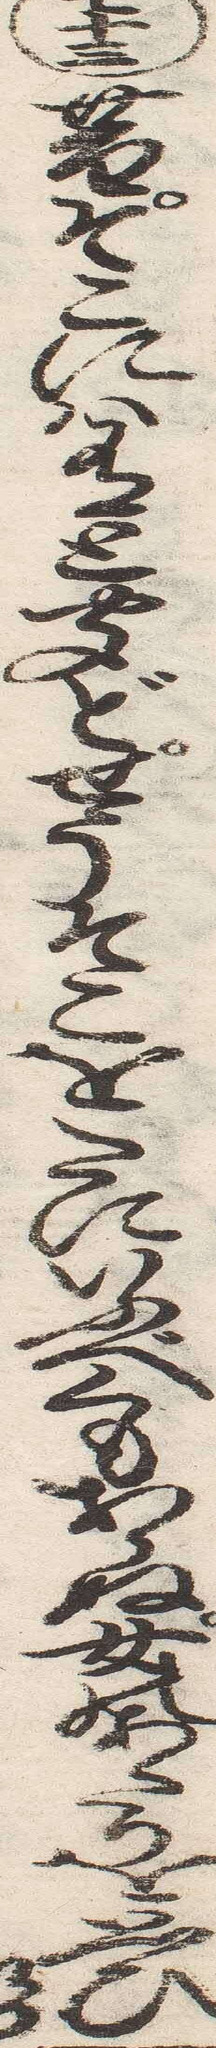七十三昔。そこには有と聞ど。せうそこをたにいふべくもあらぬ。女のあたりを思ひける
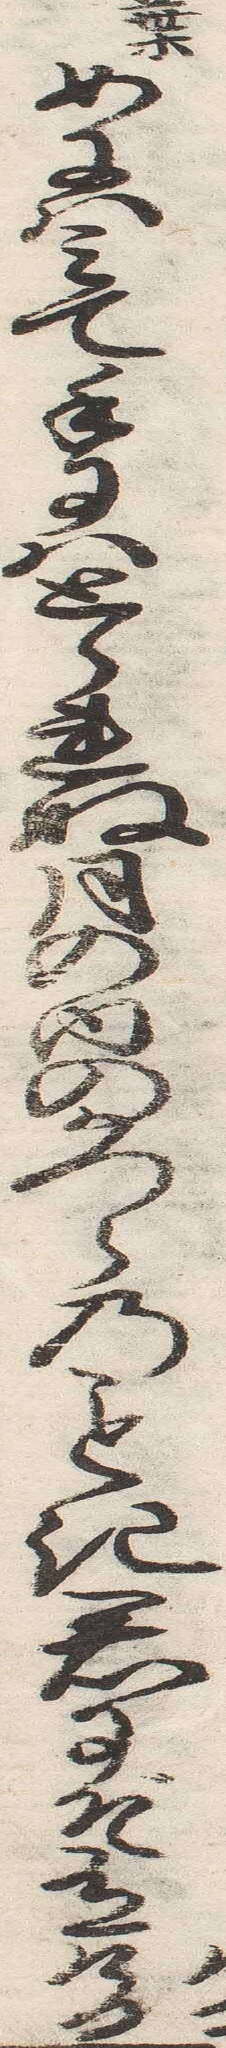万葉めにはみて手にはとられぬ月の内のかつらのことき君にぞ有ける
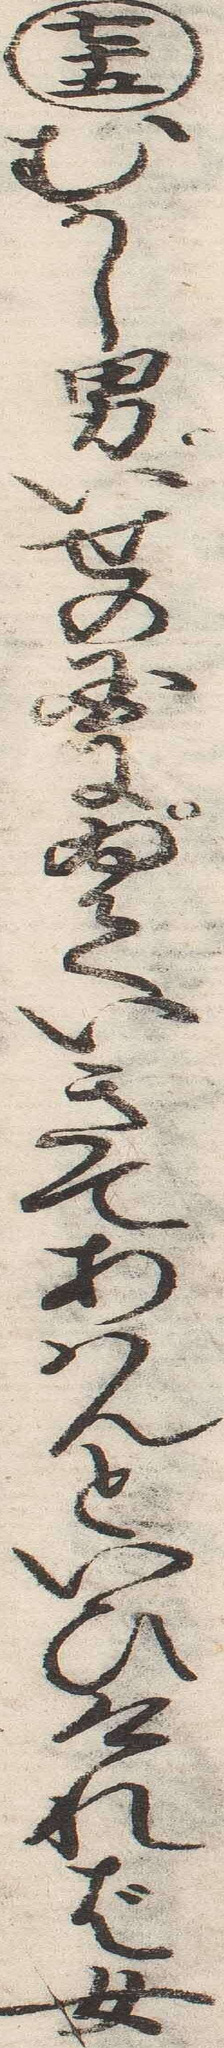七十五むかし男。いせの国に。ゐていきてあはんといひければ女
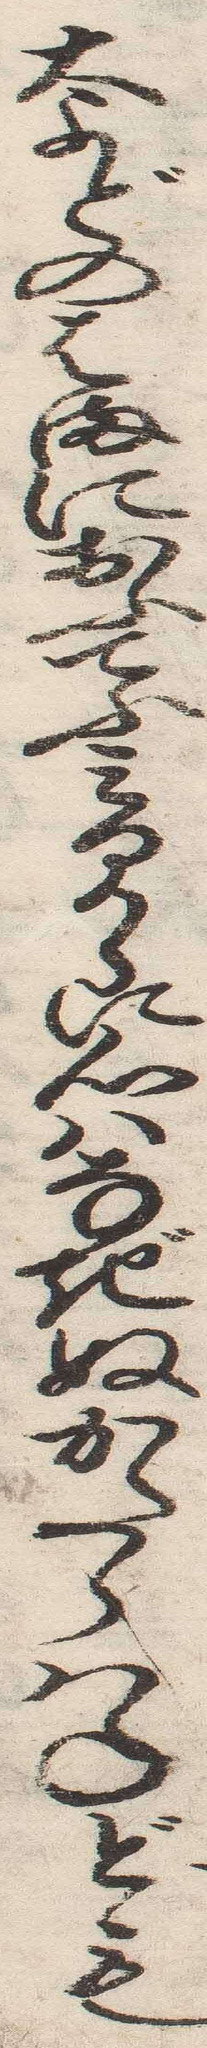大よどのはまにおふてふみるからに心はなぎぬかたらはねども
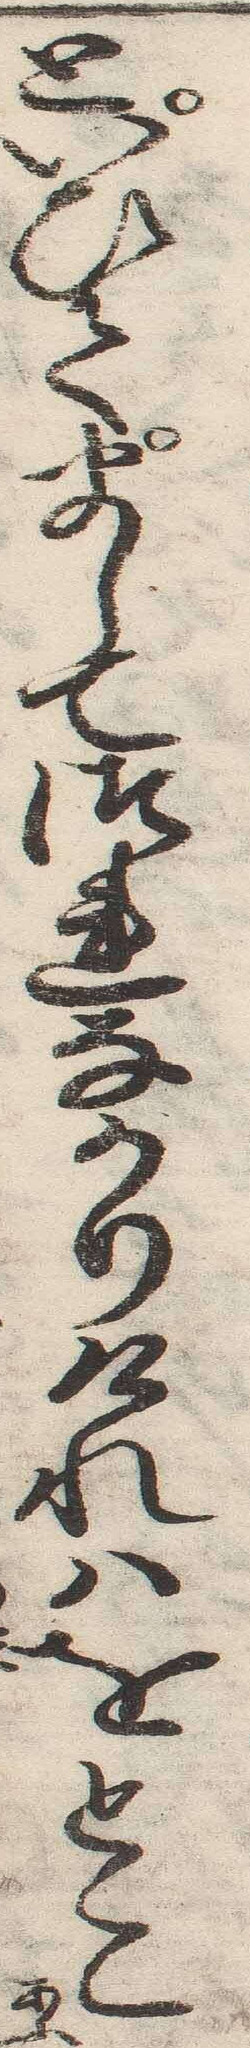と。いひて。ましてつれなかりけれはをとこ
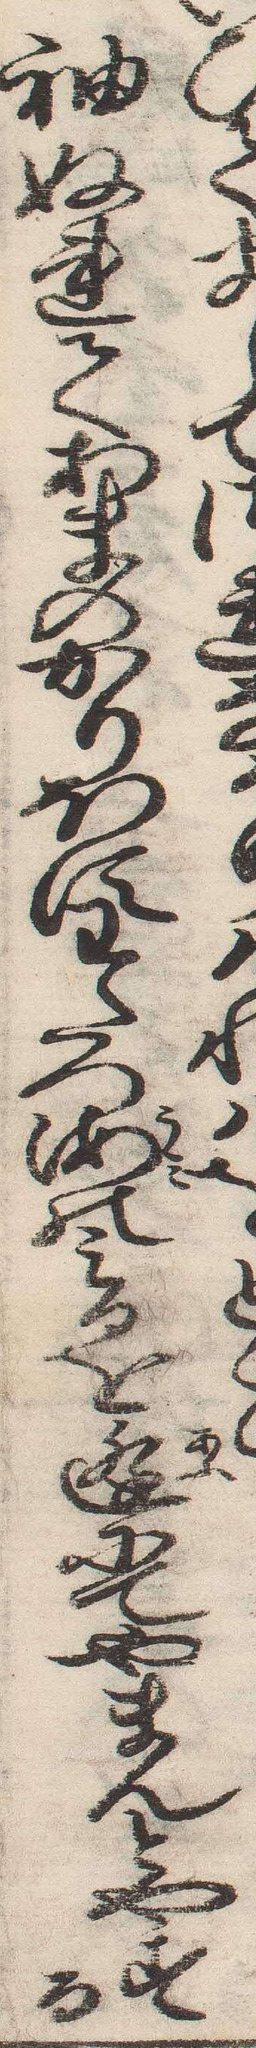袖ぬれてあまのかりほすわたつ海のみるを逢にてやまんとやする

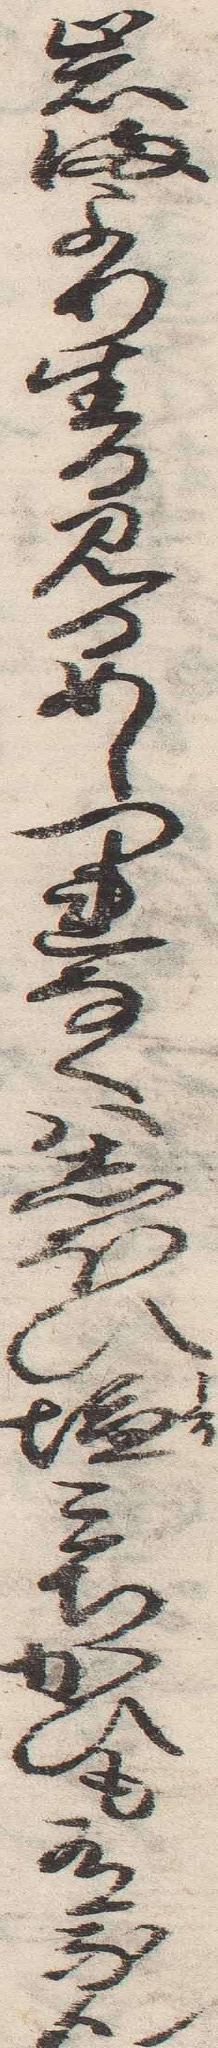岩まより生るみるめしつれなくはしほひ塩みちかひもかひも有なん
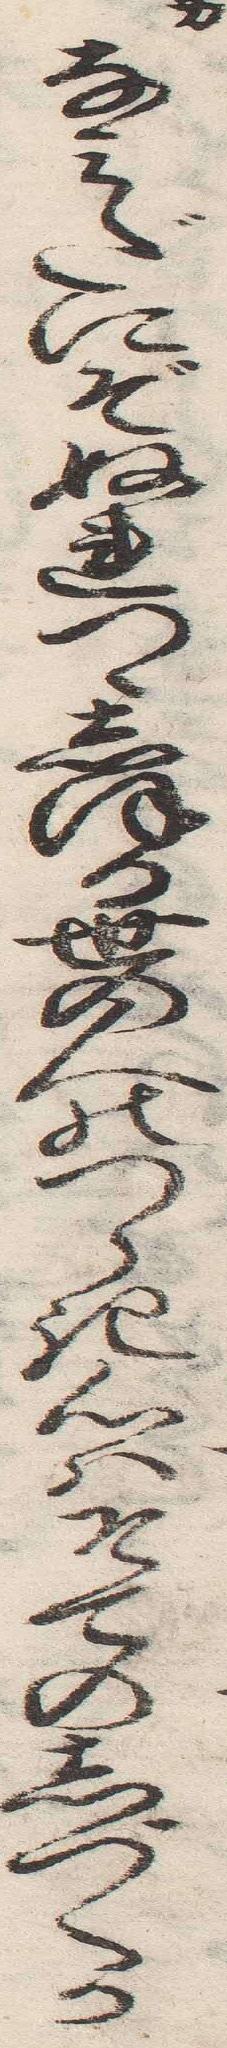なみだにぞぬれつゝしほる世の人のつらき心はそてのしづくか
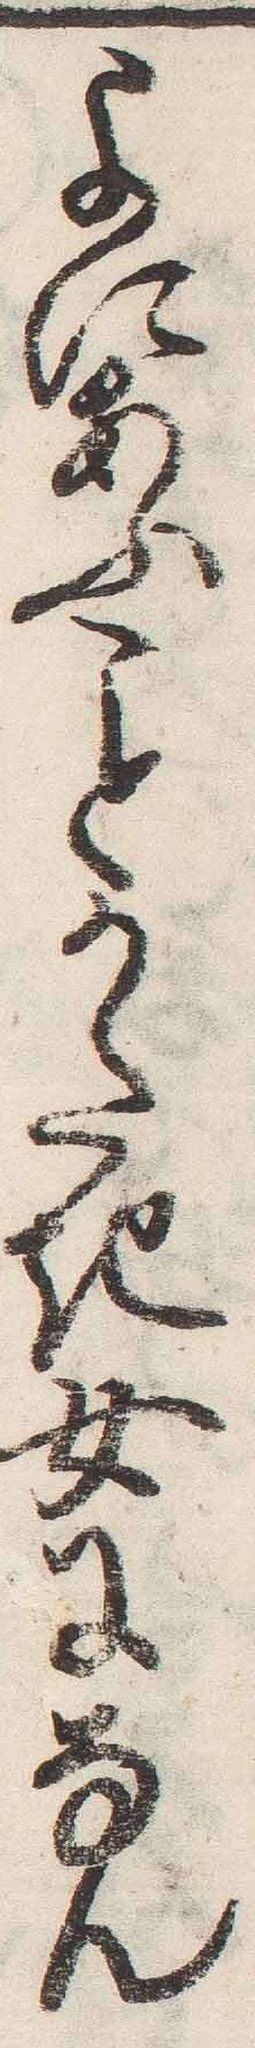よにあふことかたき女になん
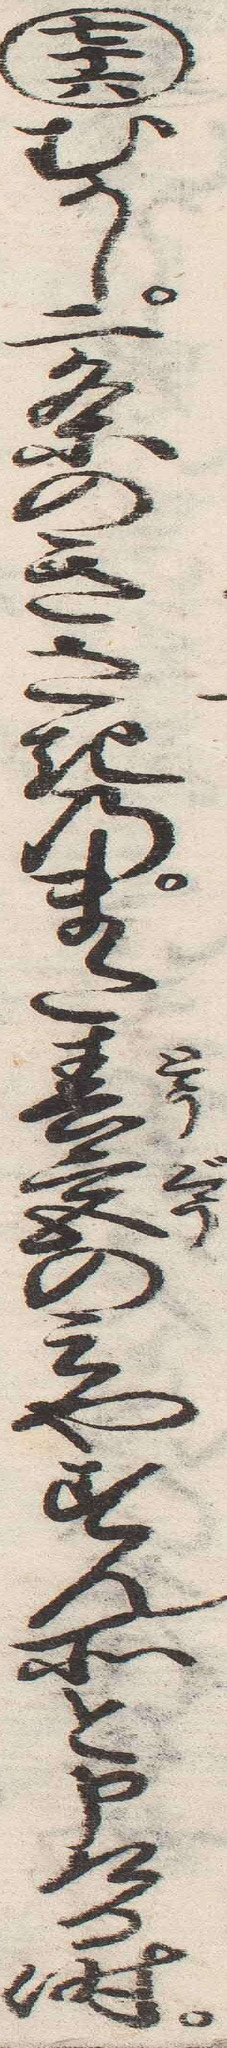七十六むかし。二条のきさきの。また春宮のみやすん所と申ける時。
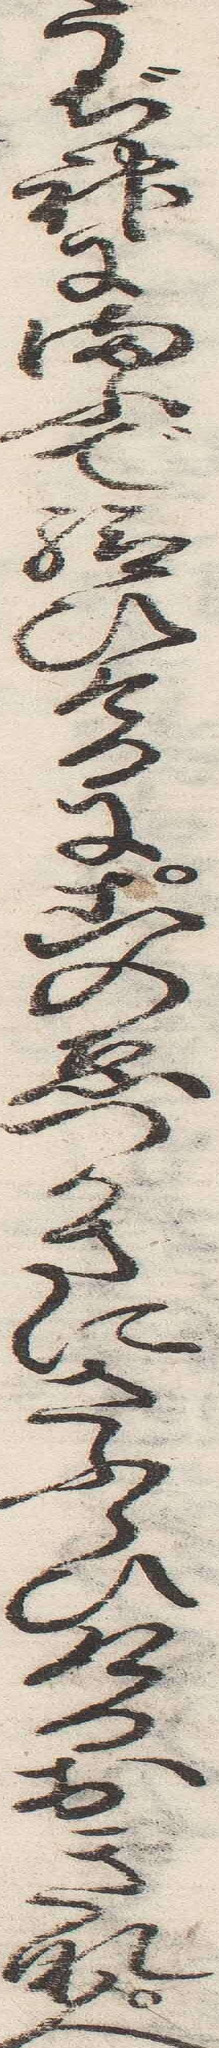うぢ神にまふで給けるに。このゑつかさにさふらひけるおきな。人
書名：伊勢物語
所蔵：東京学芸大学附属図書館 国文学研究資料館
